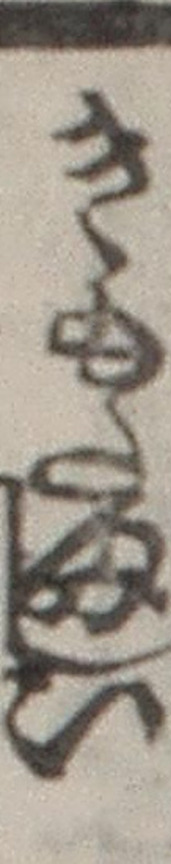きもたましひ
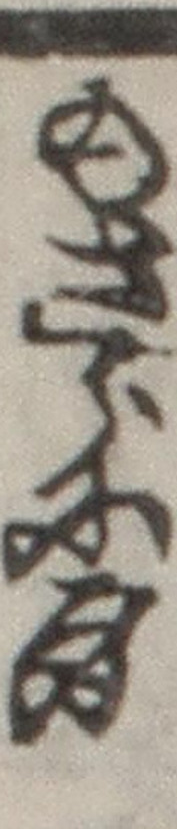もさらに身
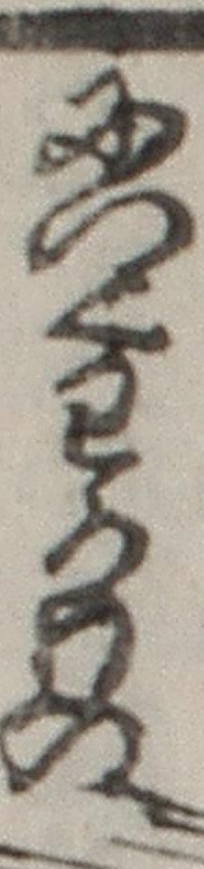につくわかもの
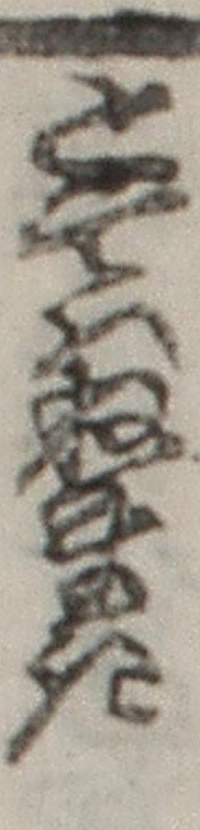とてはねまき
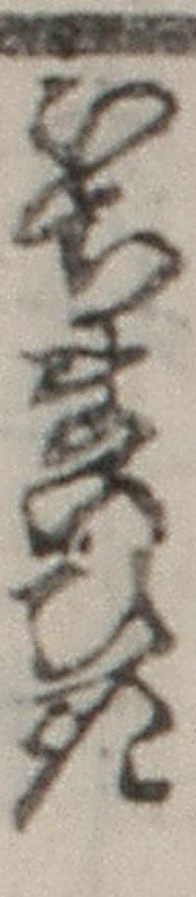いちまいひき
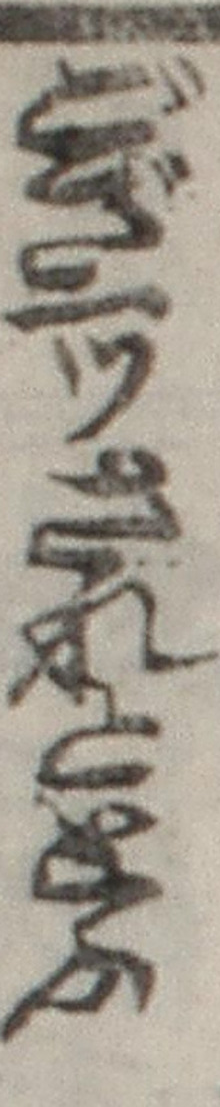ござ一つされととふ
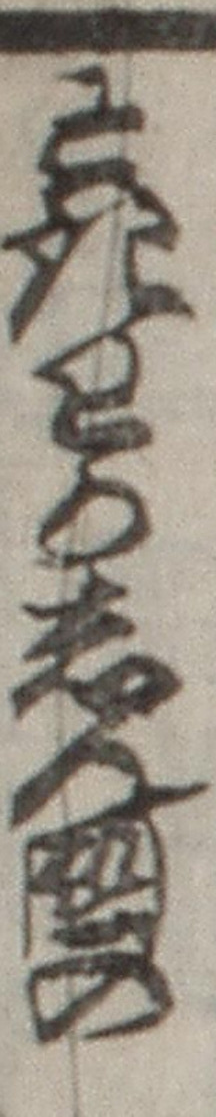ときわかしん国の

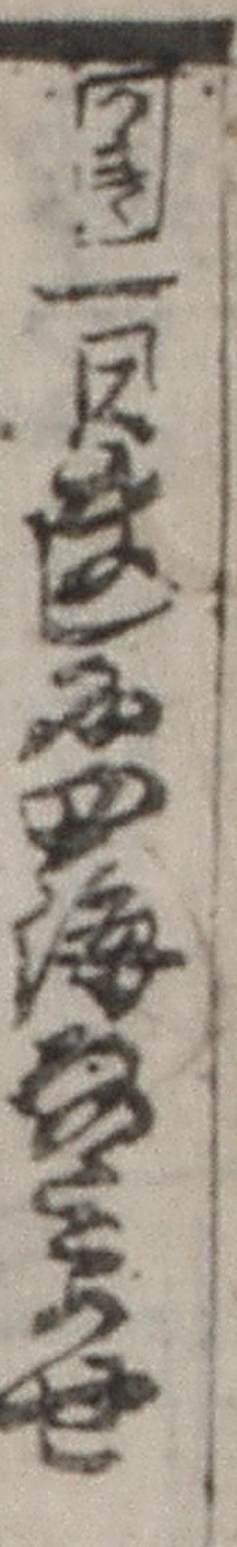つゝき一日ましに四海なみかせ
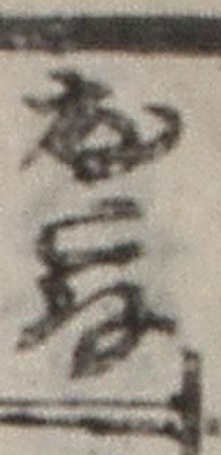おこな
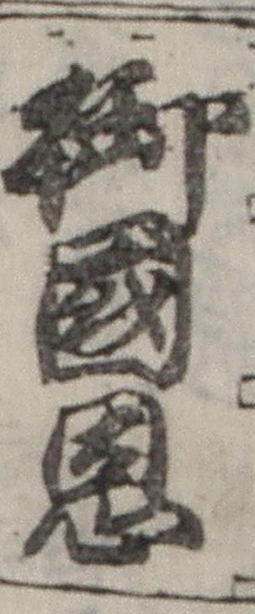御国恩
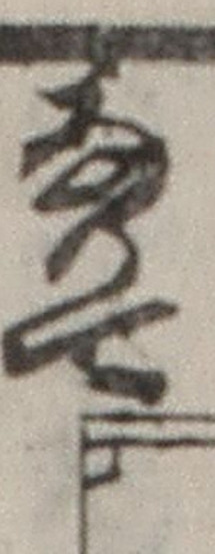なりて
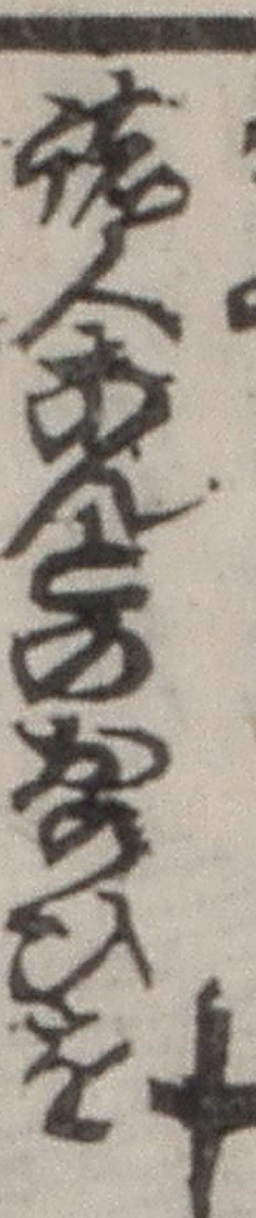諸人あんとのおもひを
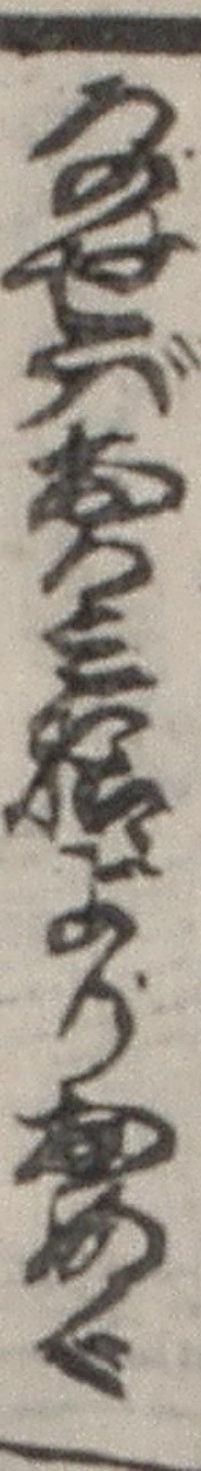なせばおかみ様よりおめぐ
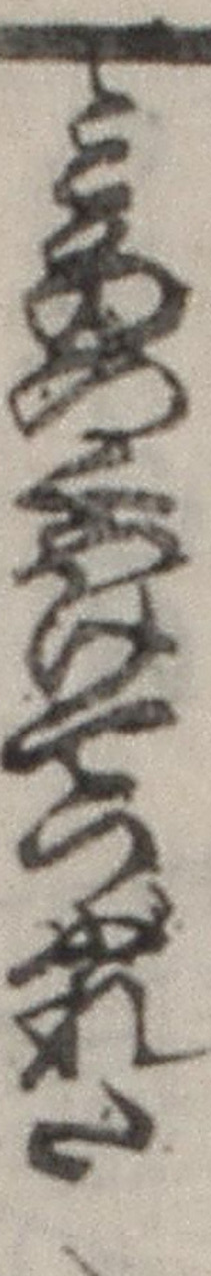みあつくやけてつぶれた
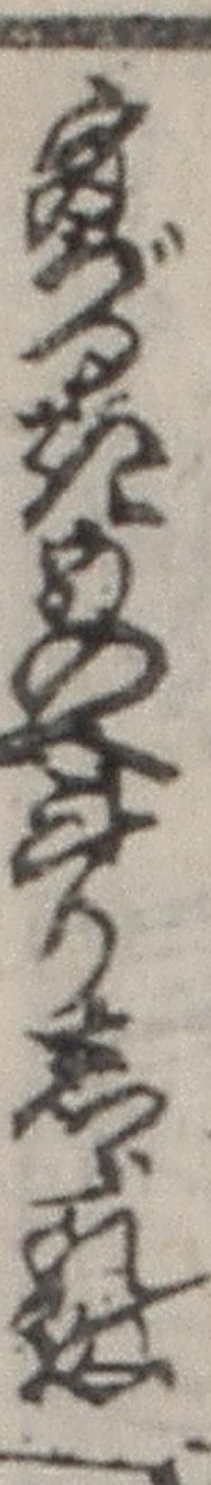身がるきものへ斗りしられぬ
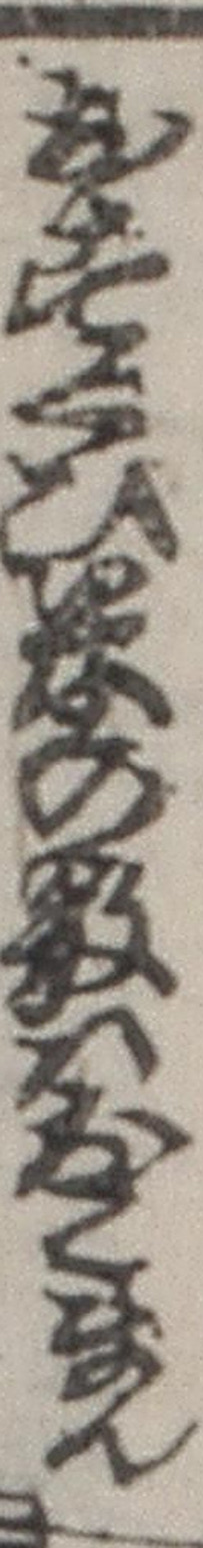おすくひ米の数はおくまん
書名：安政二卯年　江戸大地震并出火附
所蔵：東京大学地震研究所図書室 Earthquake Research Institute Library, The University of Tokyo, JAPAN
